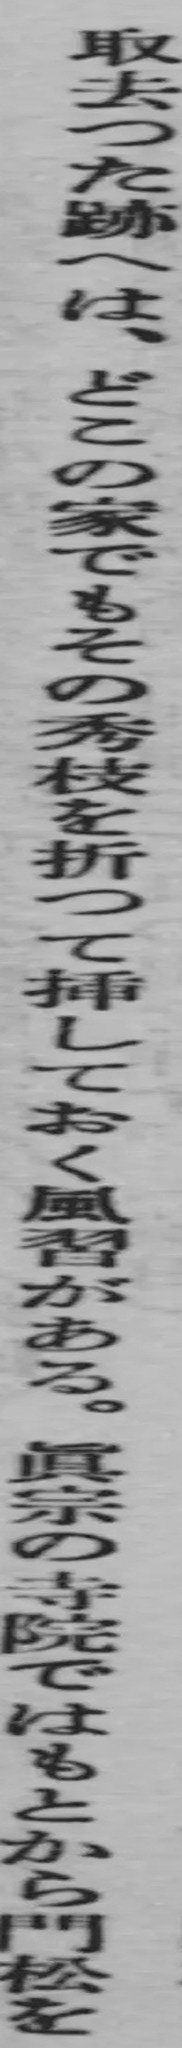取去つた跡へは、どこの家でもその秀枝を折つて挿しておく風習がある。眞宗の寺院ではもとから門松を
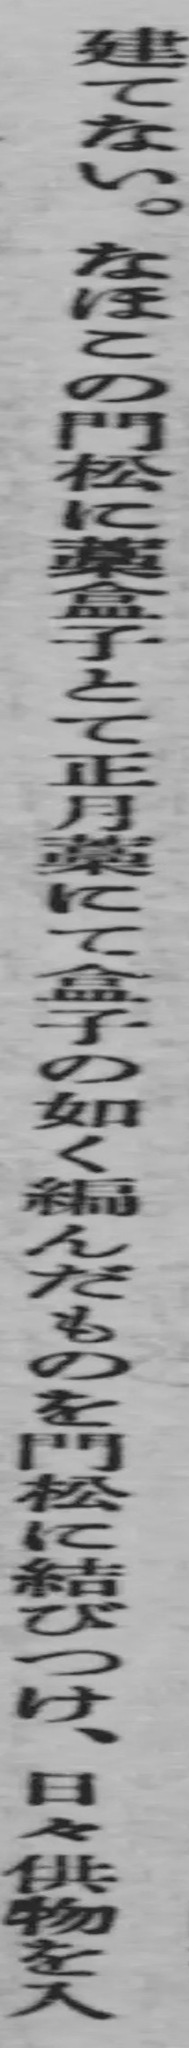建てない。なほこの門松に藁盒子とて正月藁にて盒子の如く編んだものを門松に結びつけ、日々供物を入
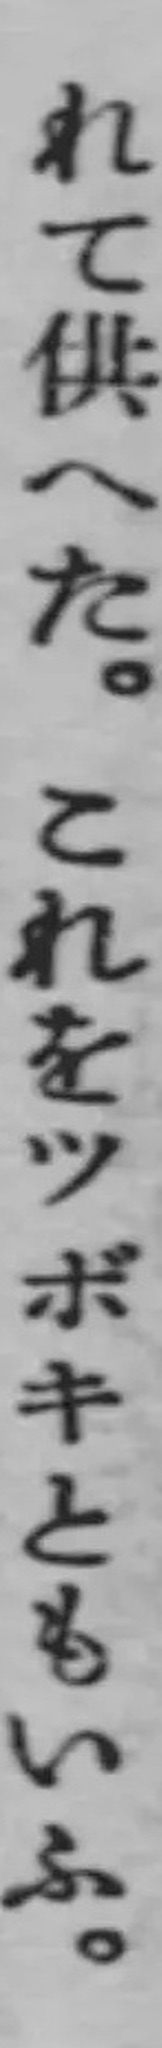れて供へた。これをツボキともいふ。
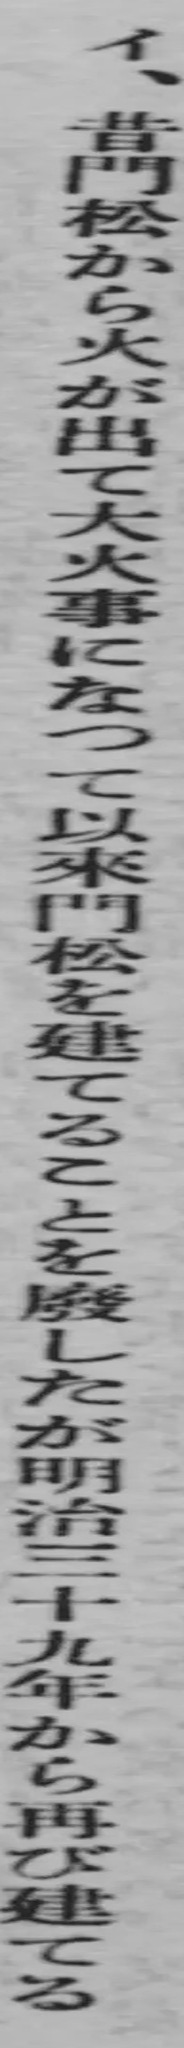イ、昔門松から火が出て大火事になつて以來門松を建てることを廢したが明治三十九年から再び建てる
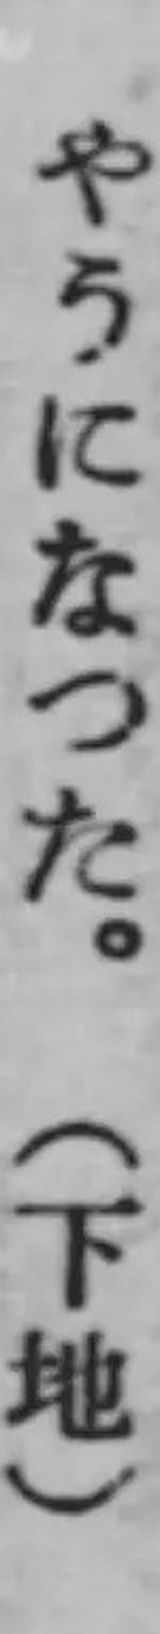やうになつた。(下地)
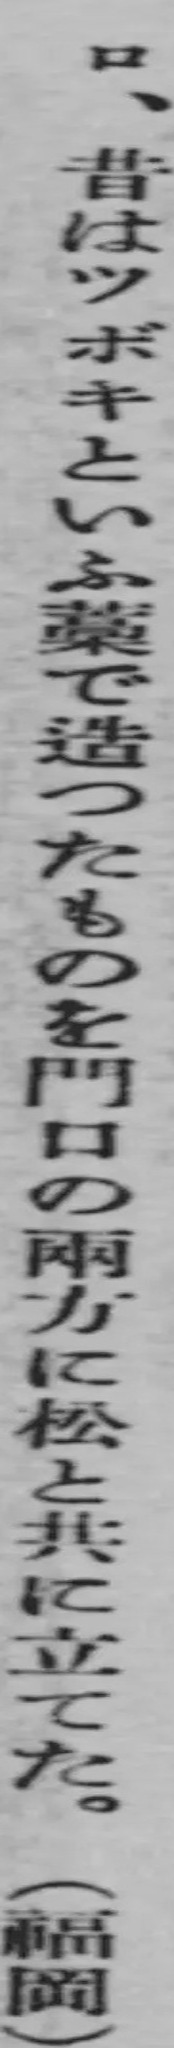ロ、昔はツボキといふ藁で造つたものを門口の兩方に松と共に立てた。(福岡)
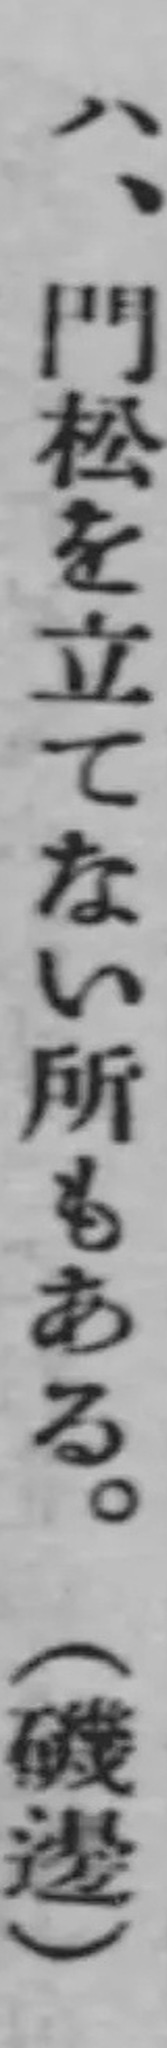ハ、門松を立てない所もある。(磯邊)
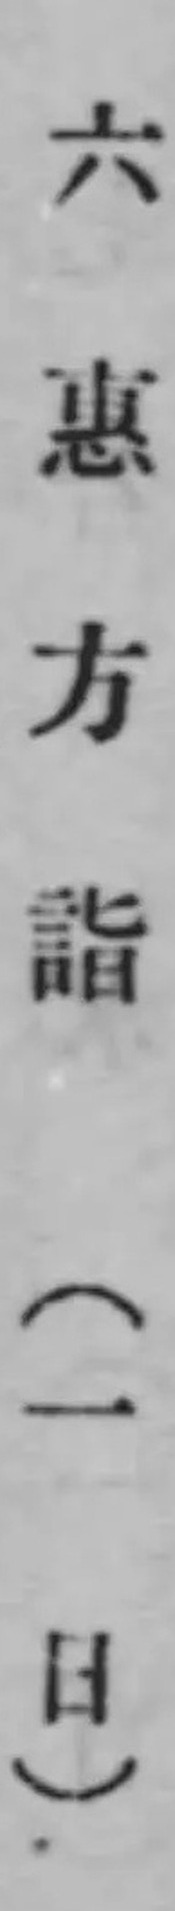六惠方詣(一日)
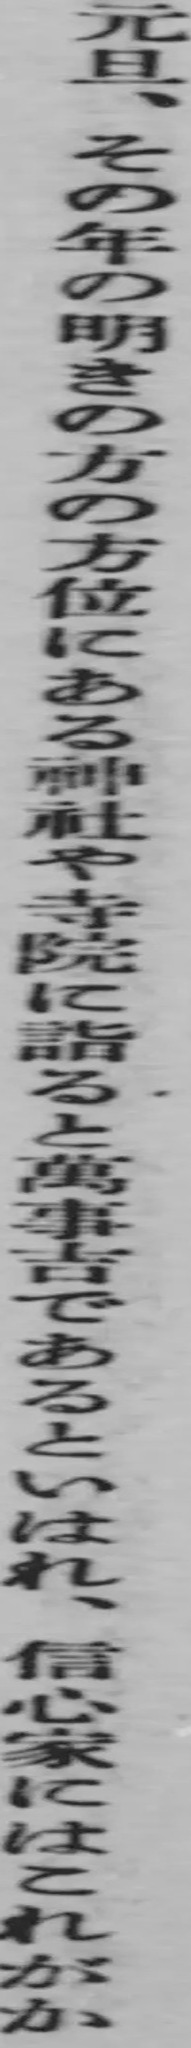元旦、その年の明きの方の方位にある神社や寺院に詣ると萬事吉であるといはれ、信心家にはこれがか

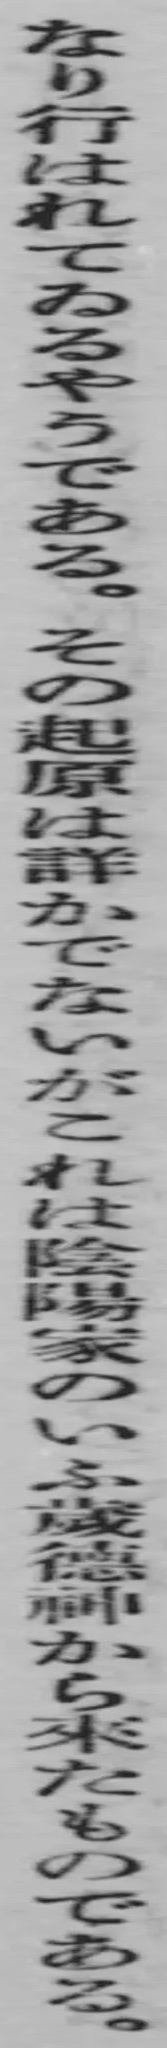なり行はれてゐるやうである。その起原は詳かでないがこれは陰陽家のいふ歲德神から來たものである。
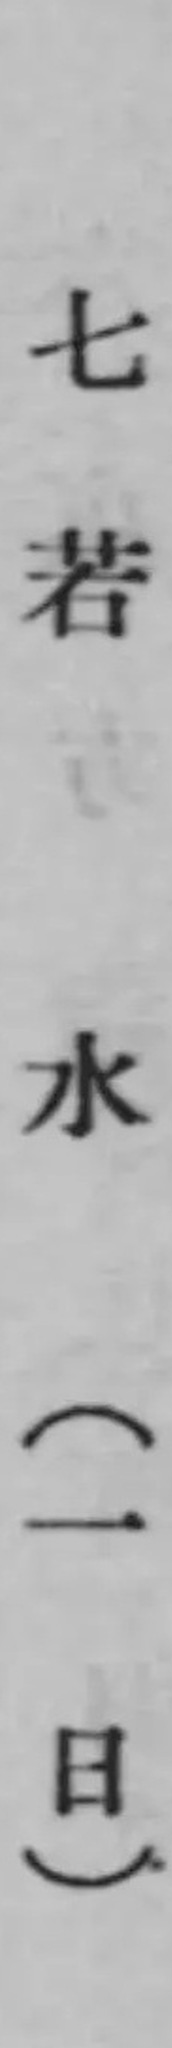七若水(一日)
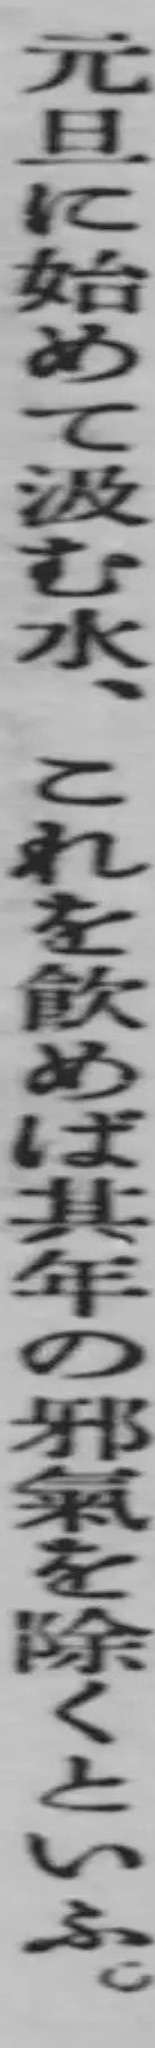元旦に始めて汲む水、これを飮めば其年の邪氣を除くといふ。
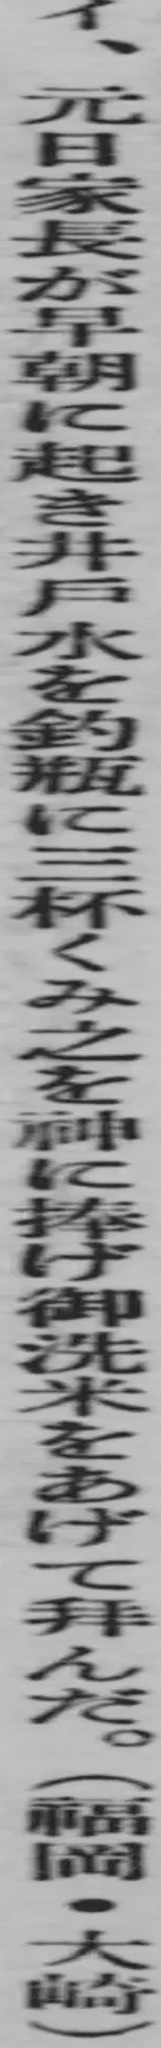イ、元日家長が早朝に起き井戸水を釣瓶に三杯くみ之を神に捧げ御洗米をあげて拜んだ。(福岡・大崎)
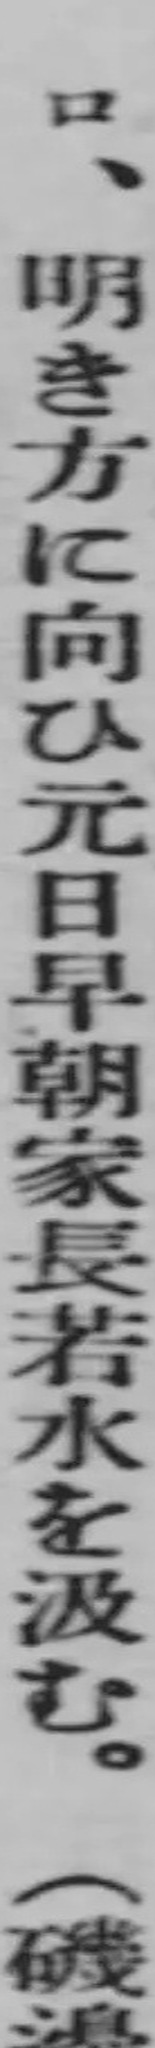ロ、明き方に向ひ元日早朝家長若水を汲む。(磯邊)
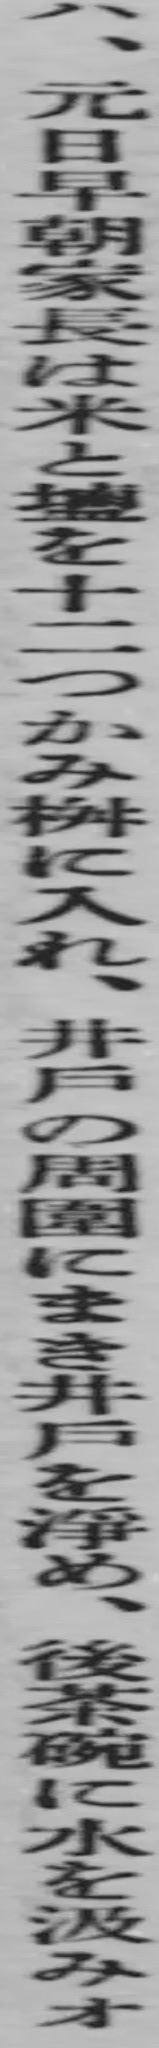ハ、元日早朝家長は米と𪉩を十二つかみ桝に入れ、井戸の周圍にまき井戸を淨め、後茶碗に水を汲みオ
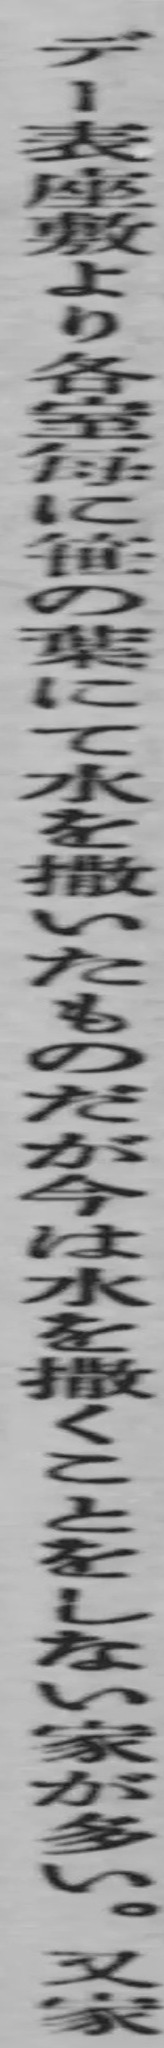デー表座敷より各室每に笹の葉にて水を撒いたものだが今は水を撒くことをしない家が多い。又家
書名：豊橋の年中行事
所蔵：国立国会図書館 National Diet Library, JAPAN
